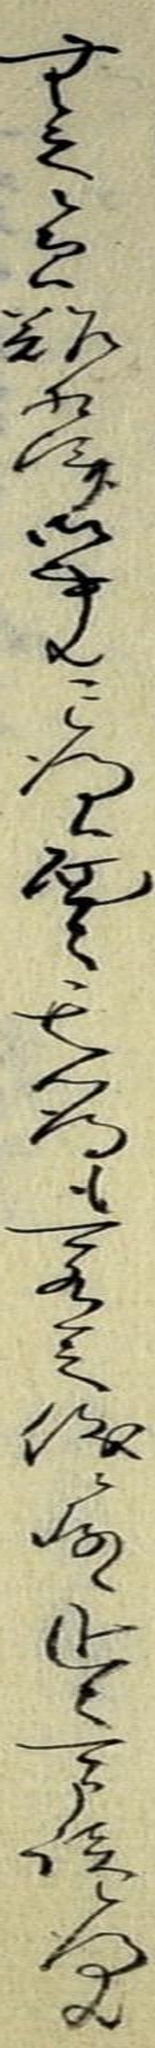無之候而は難相済御事共に候得は面々其心得も可有之儀に存候追々可申談候得共
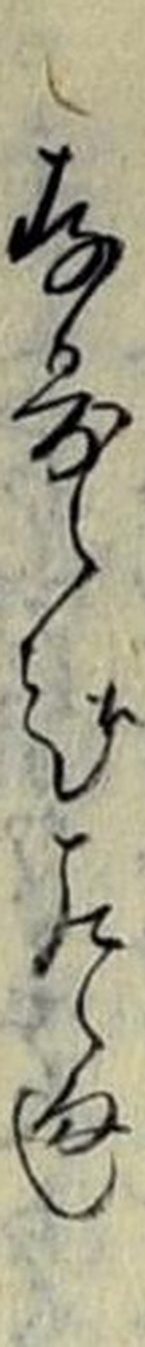存寄之趣左之通
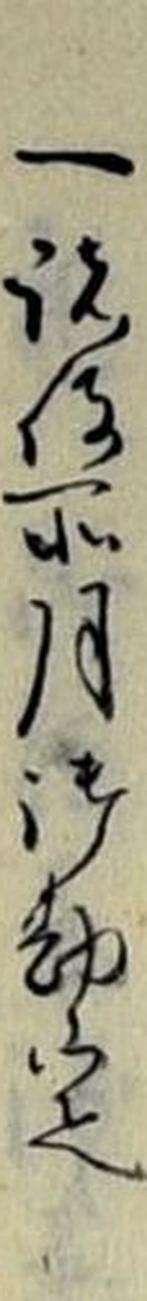一諸役所月御勘定
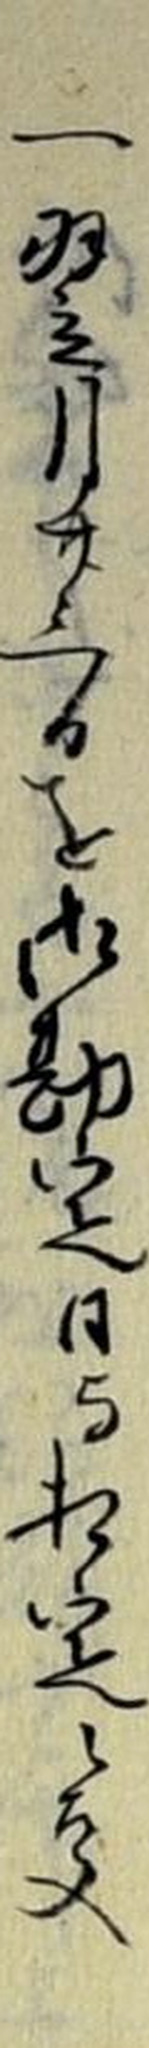一翌月廿三日を御勘定日与相定候事
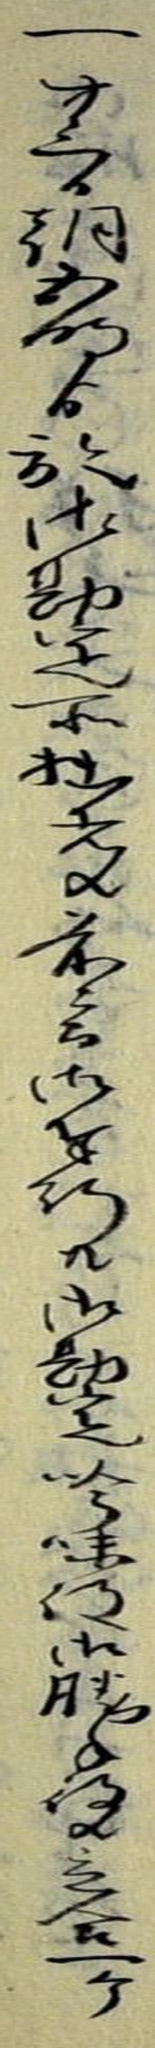一廿三日朝五時ゟ於御勘定所拙者共前に而御奉行共御勘定吟味役御勝手役共立合一ケ
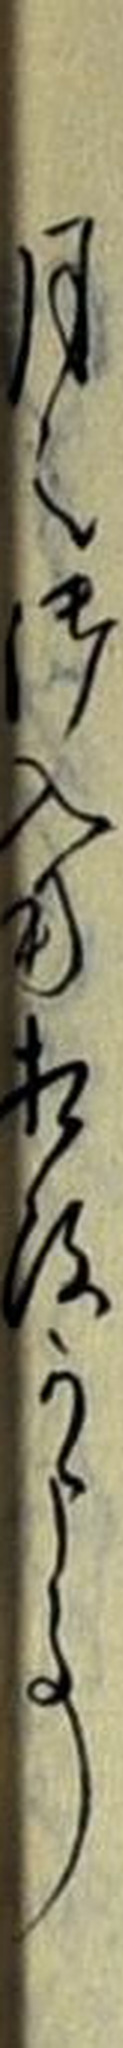月之御入用相改可申事
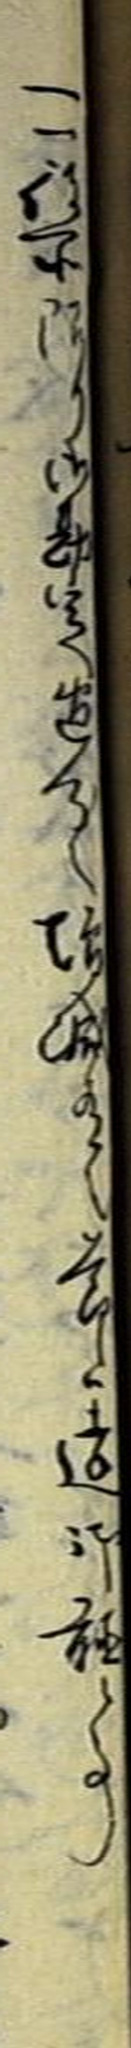一一役所限り御勘定宜分之増減有之節は達御聴候事
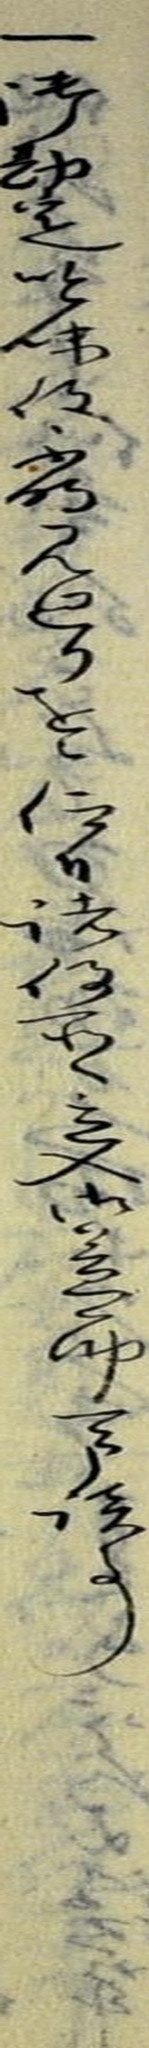一御勘定吟味役不時見廻りを被仰付諸役所へ立入御益筋可申談事
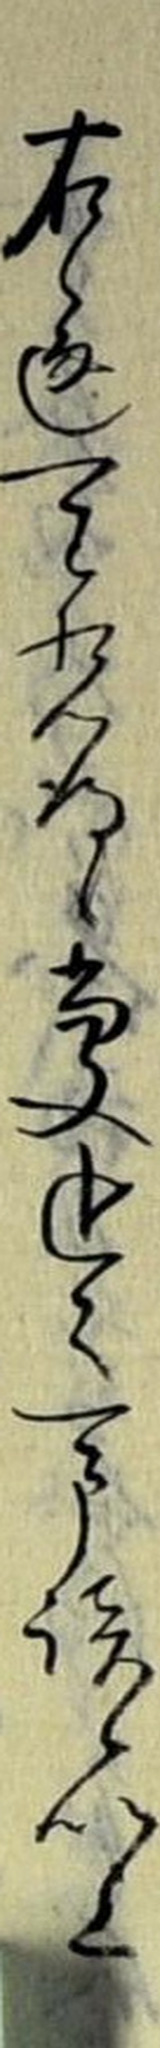右之通可被相心得候尚又追々可申談候以上
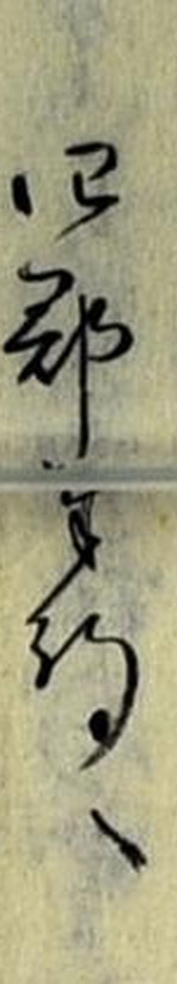四郡奉行へ
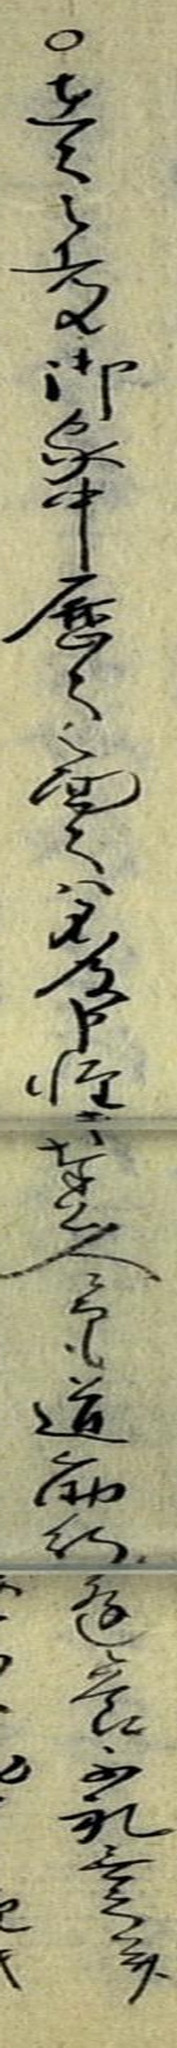〇在々之者共御家中歴々之面々は不及申軽き奉公人に而も道筋行逢候節不礼無之并
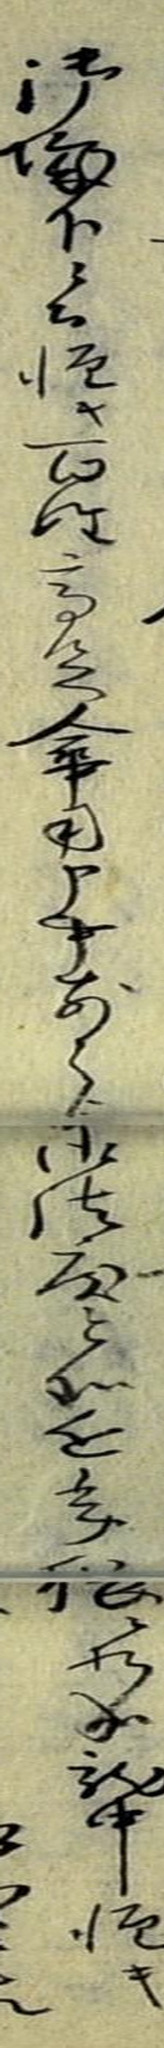御城下に而軽き百姓高足傘用申事前々ゟ御法度候処近年猥に相成就中軽き
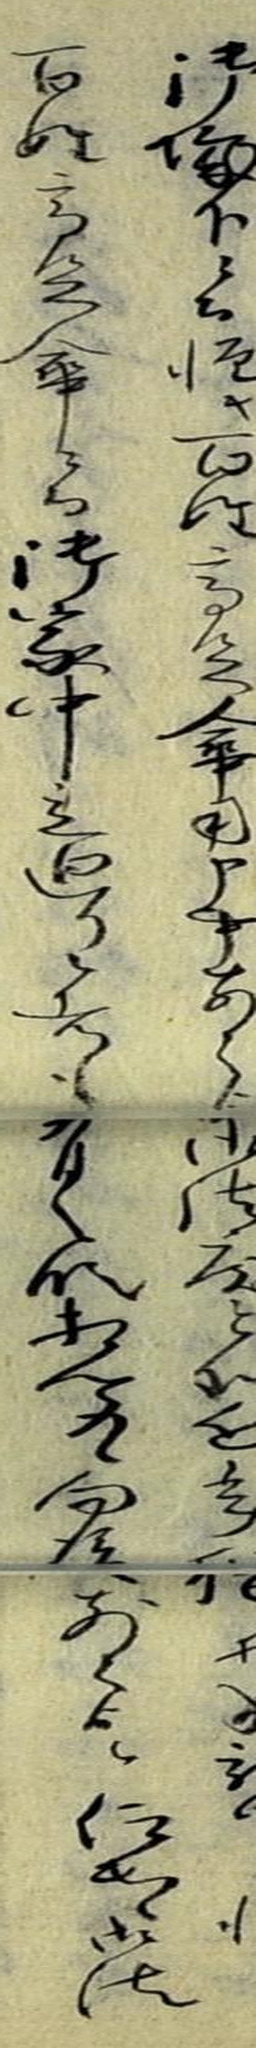百姓高足傘に而御家中立廻り候者も有之段相聞候向後前々ゟ被仰出候御法
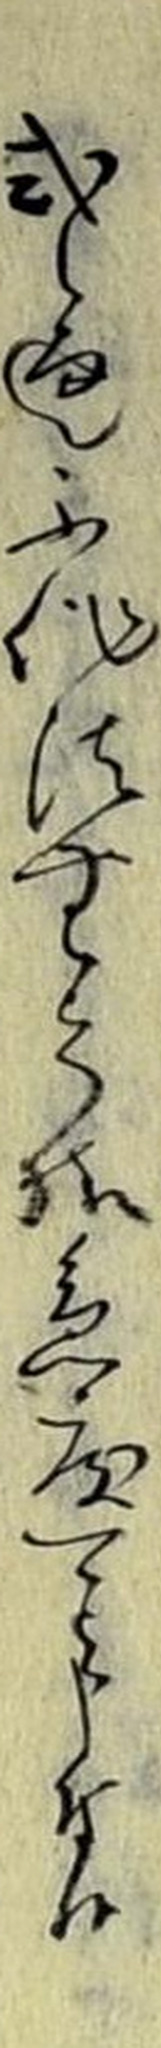式之通不作法無之様急度可被申付候
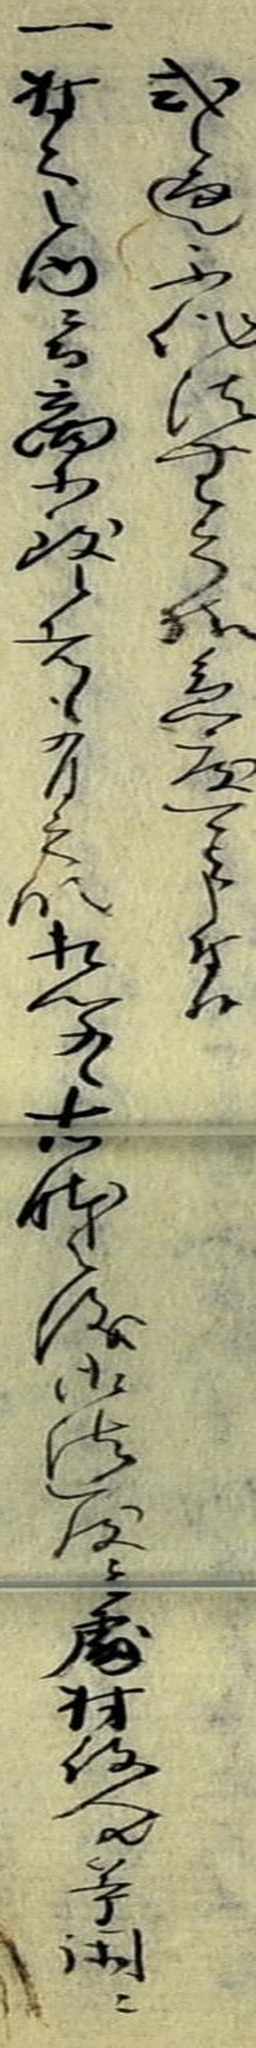一村々之内に而商等致候者も有之段相聞候右体之儀御法度に候処村役人共等閑に
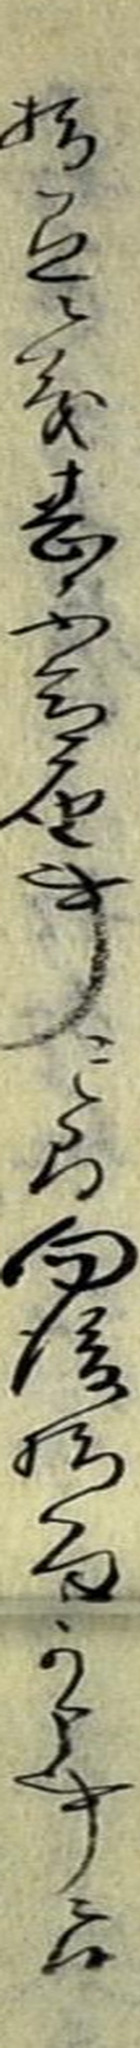指置候義甚不参届事に候間向後指留可申事に候
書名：命令之部 二
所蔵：福井県文書館 Fukui Prefectural Archives
